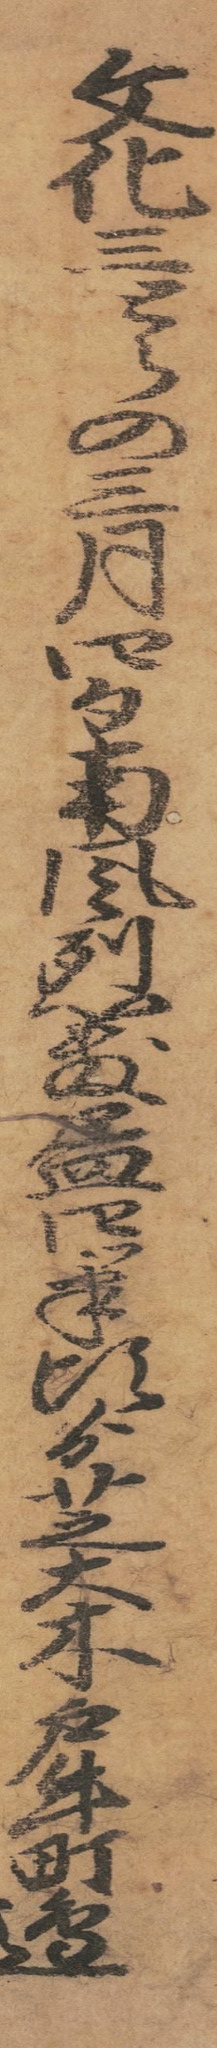文化三とらの三月四日南風烈敷昼四ッ半頃芝大木戸牛町邊
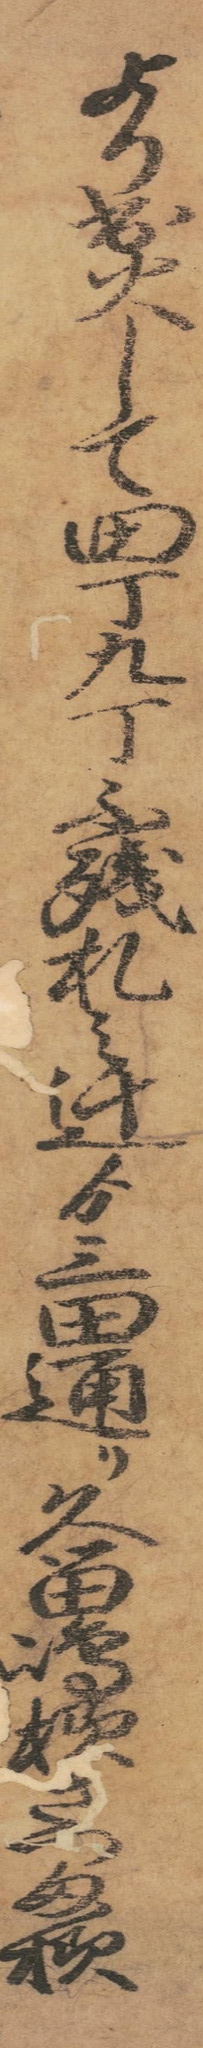より出火して田丁九丁不残札之辻ゟ三田通り久留嶋様さつま様
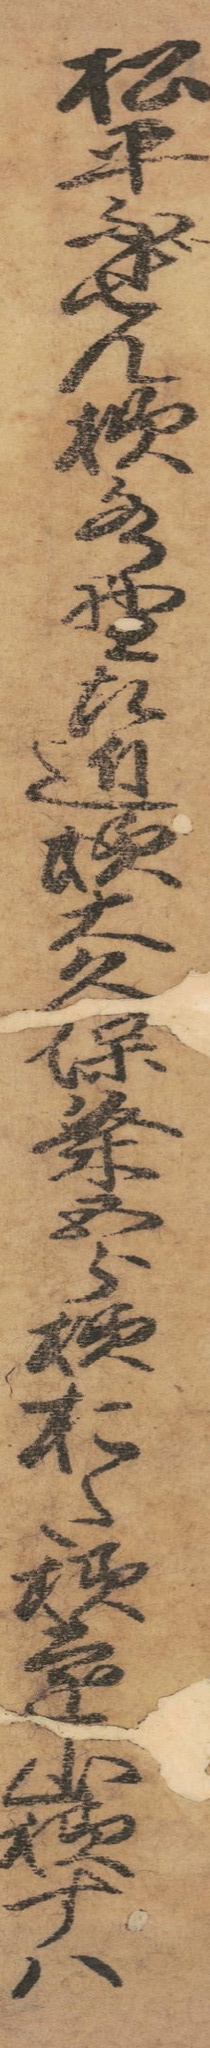松平ふぜん様水野左近様大久保粂五郎様おた様遠山様すハ
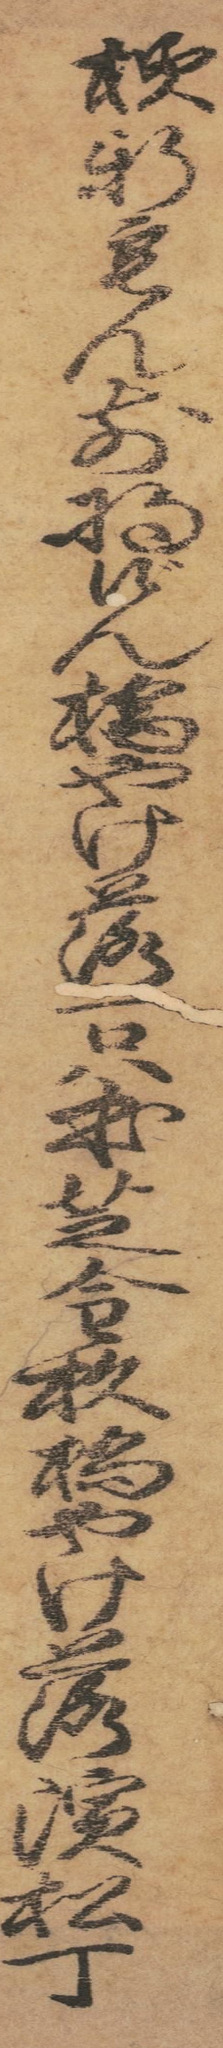様新もん前将げん橋やけ落一口ハ本芝金杉橋やけ落濱松丁
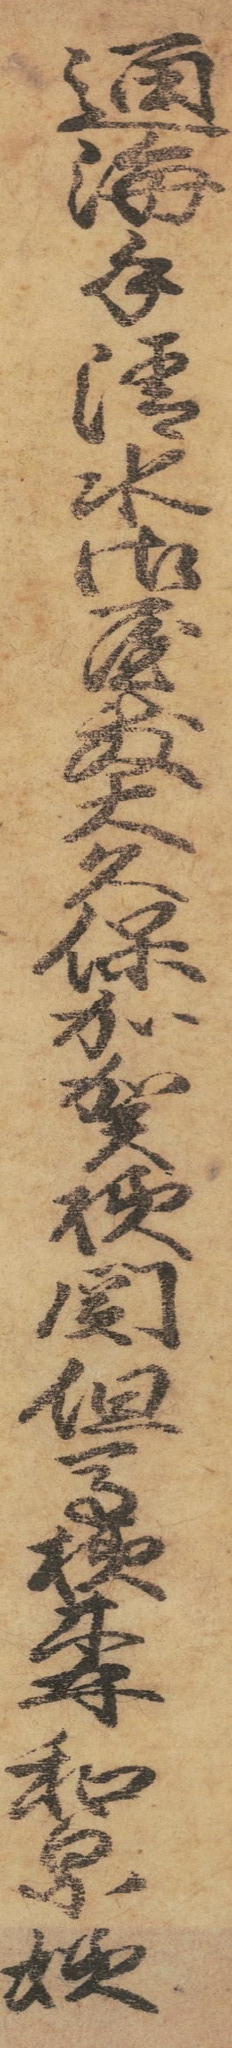通海手清水御屋敷大久保加賀様関但馬様森和泉様
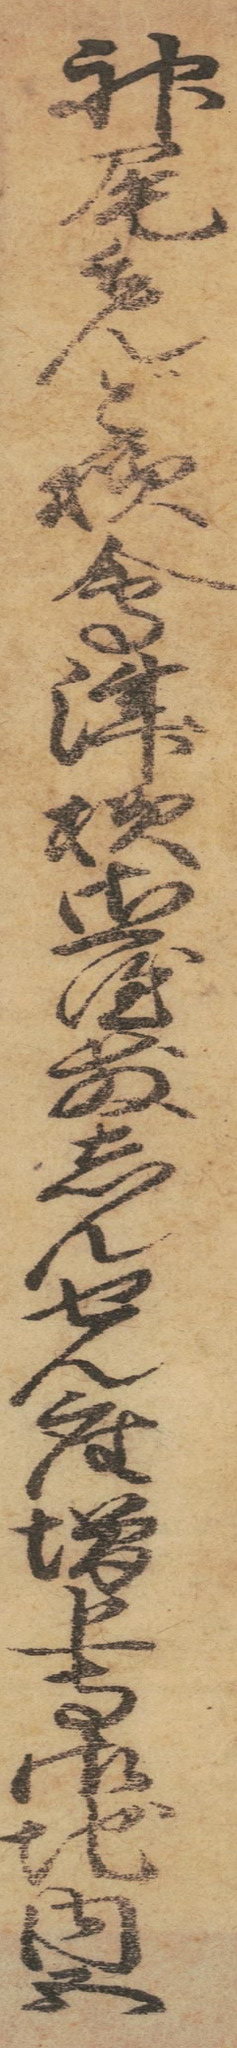神尾もんど様会津様御屋敷しんせん座増上寺御地内五
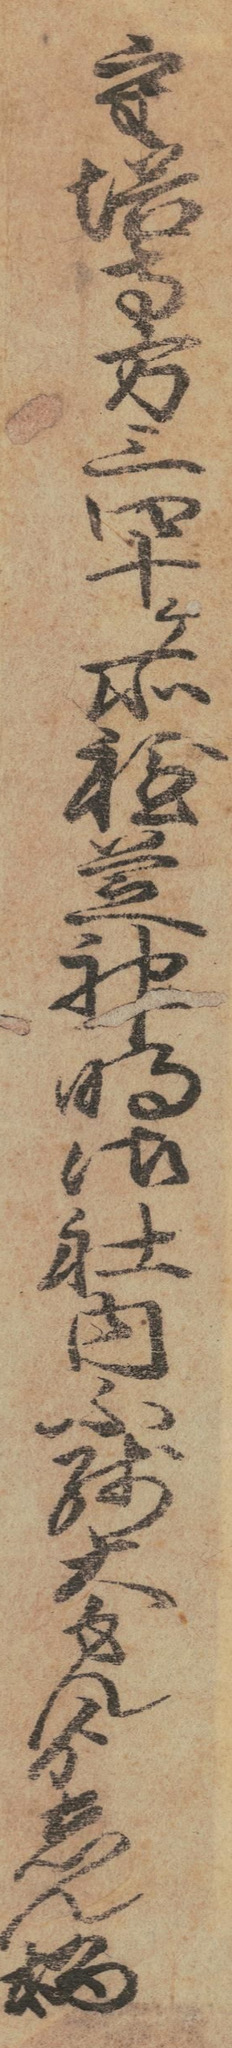重塔寺方三四十ケ所程芝神明御社内不残大もんゟしん橋
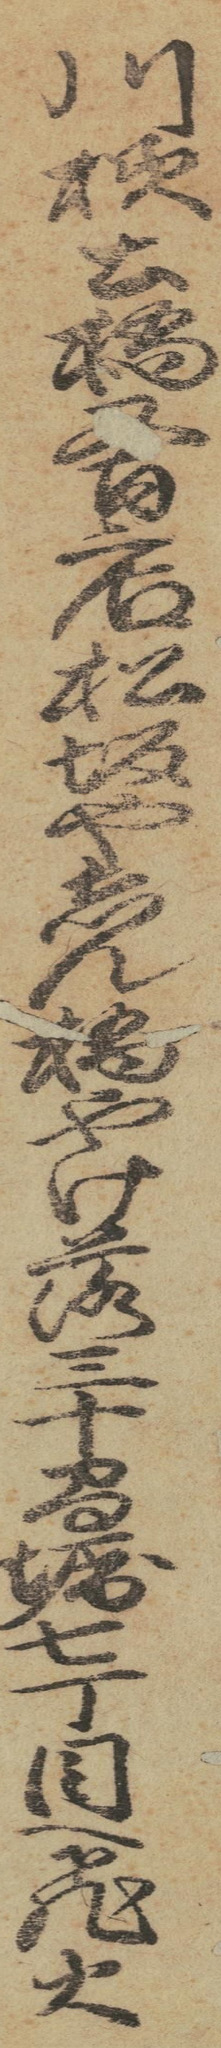川様土橋八百店松坂やしん橋やけ落三十間堀七丁目へ飛火
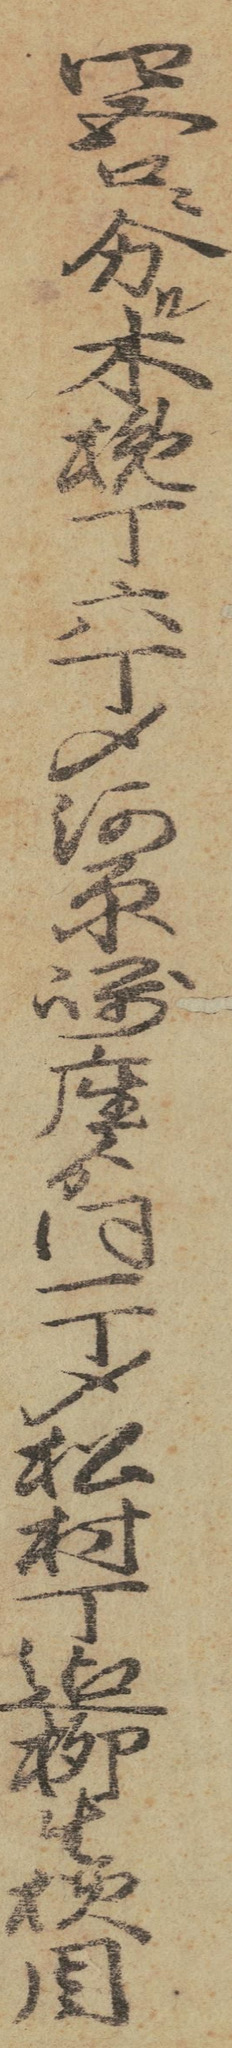四五口ニ分ル木挽丁六丁目河原崎座ゟ同一丁目〆松村丁迄柳生様周
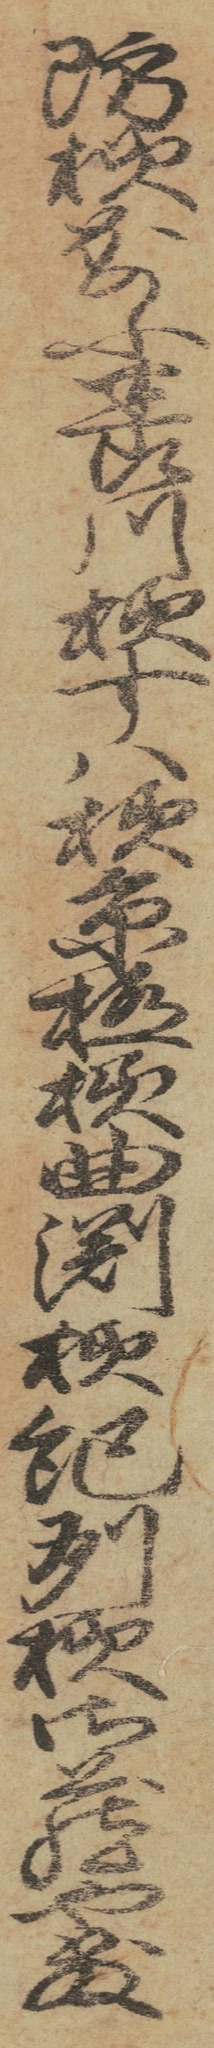防様かのふ養川様すハ様京極様極渕様紀州様御蔵屋敷
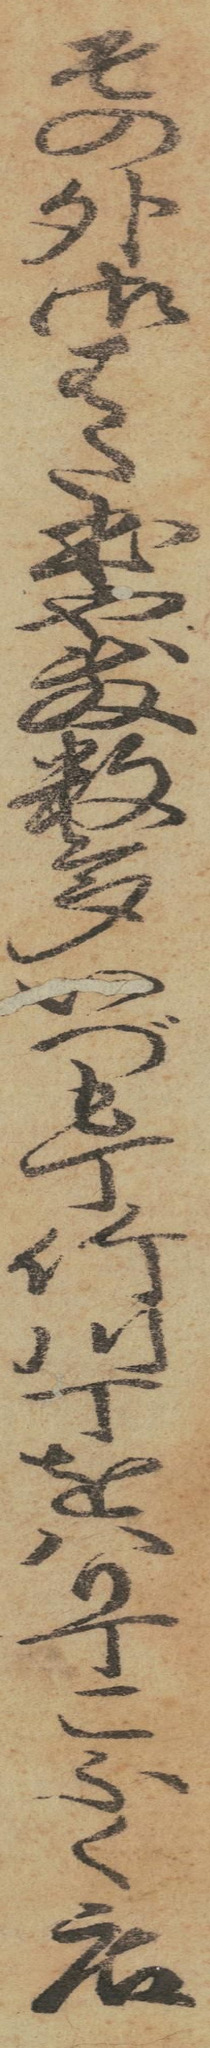その外御わたや敷数多いづも丁竹川丁をハり丁こふく店
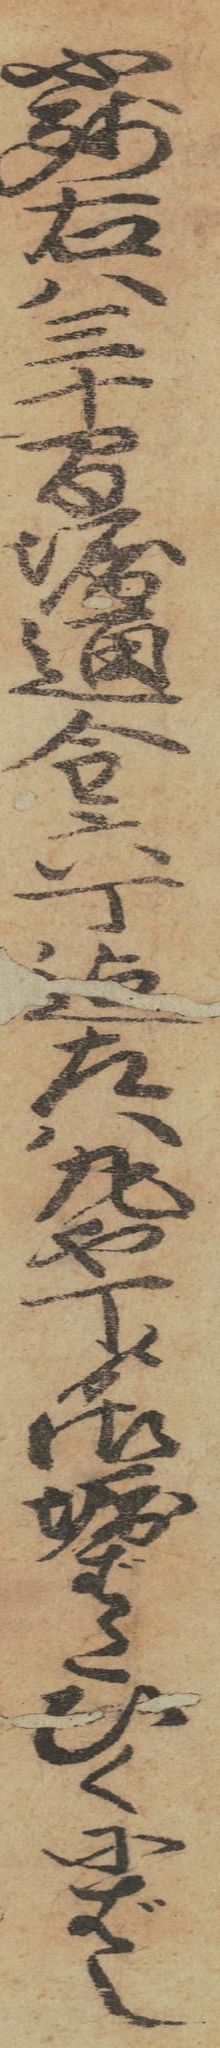不残右ハ三十間堀通金六丁迄左ハ丸や丁ゟ御堀ばたひくにばし
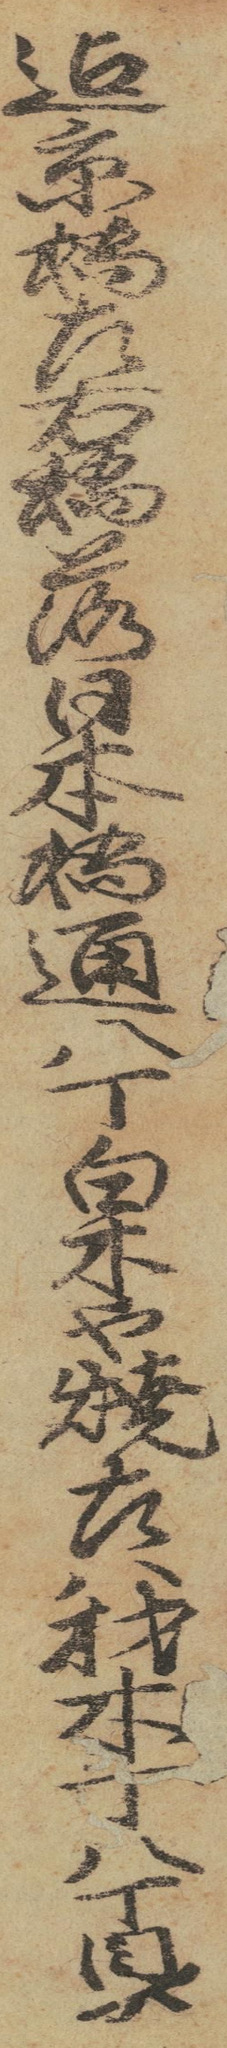迄京橋左右橋落日本橋通八丁白木や焼左ハ材木丁八丁目ゟ
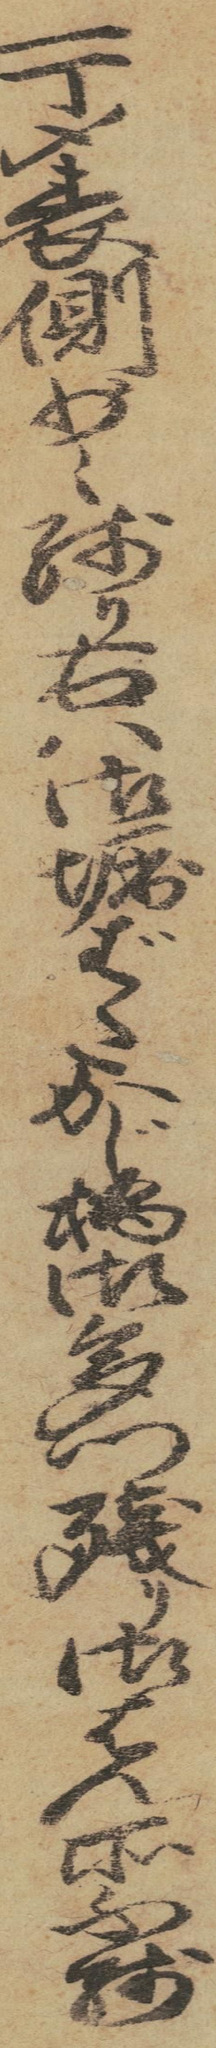一丁〆表側少々残り右ハ御堀ばたかじ橋御多門残り御はん所不残
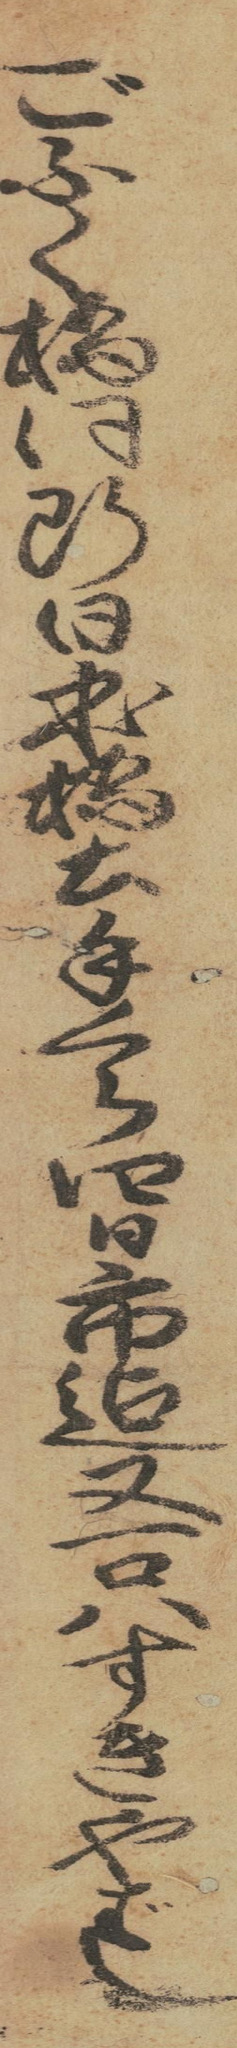ごふく橋同断日本橋土手くら四日市迄又一口ハすきやばし
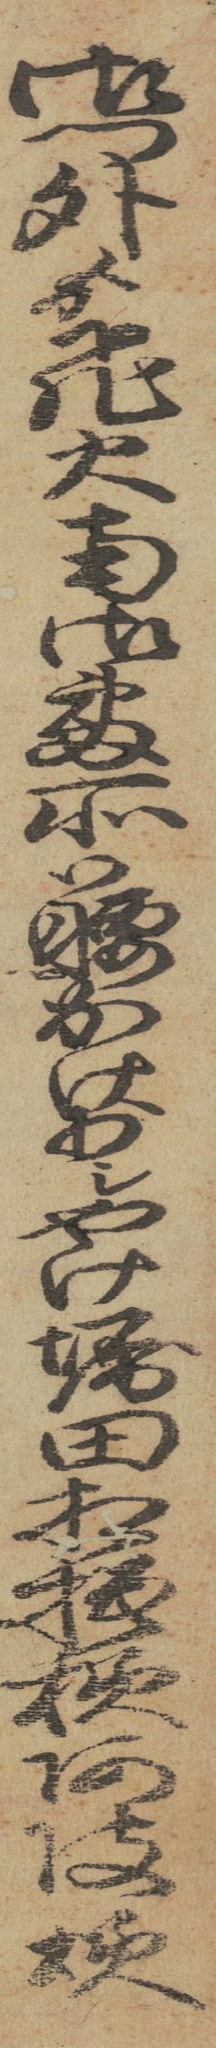御門外ゟ飛火南御番所御腰かけ少しやけ堀田相模様阿波様
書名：出火方角場所附
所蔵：東京大学地震研究所図書室 Earthquake Research Institute Library, The University of Tokyo, JAPAN
